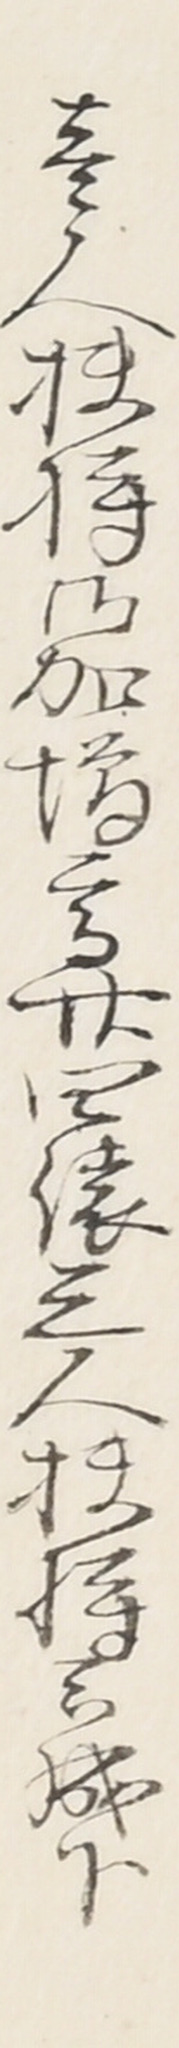壱人扶持御加増高廿四俵三人扶持被成下
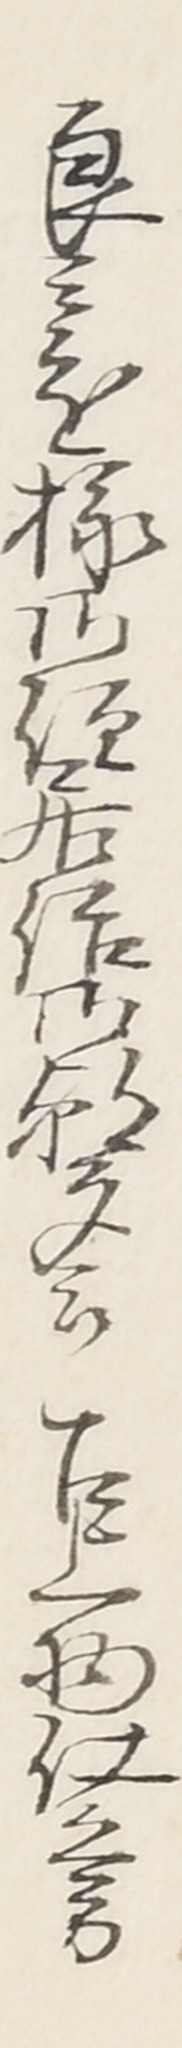良之進様御住居詰御朝夕被召上物仕立方
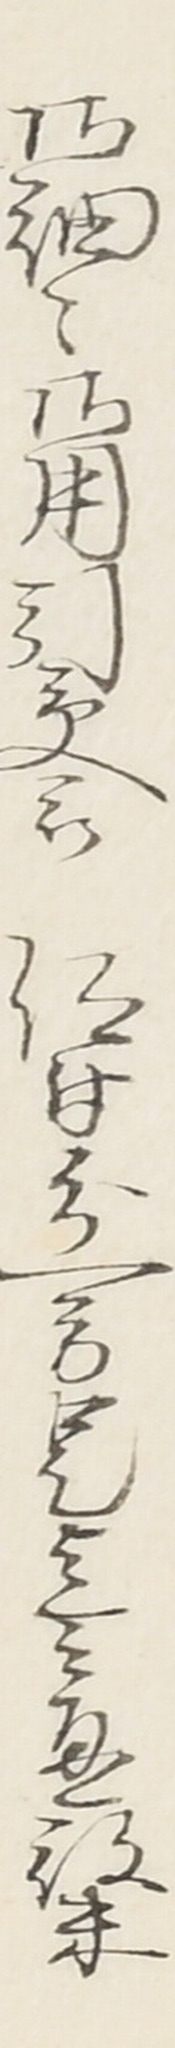御細々御用引受被仰付分一方是迄之役米
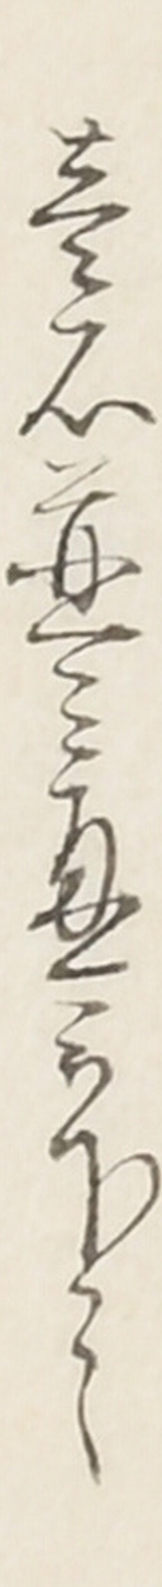壱石並之通被下之
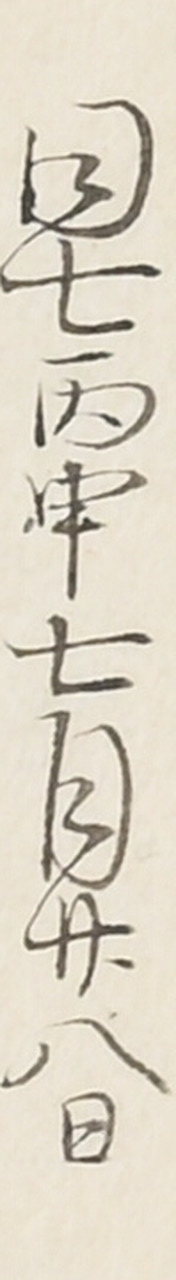一同七丙申七月廿八日
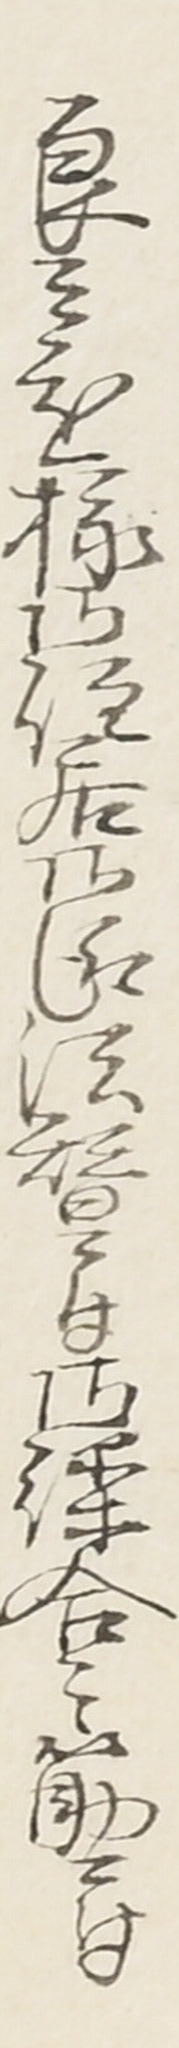良之進様御住居御趣法替ニ付御繰合之筋二付
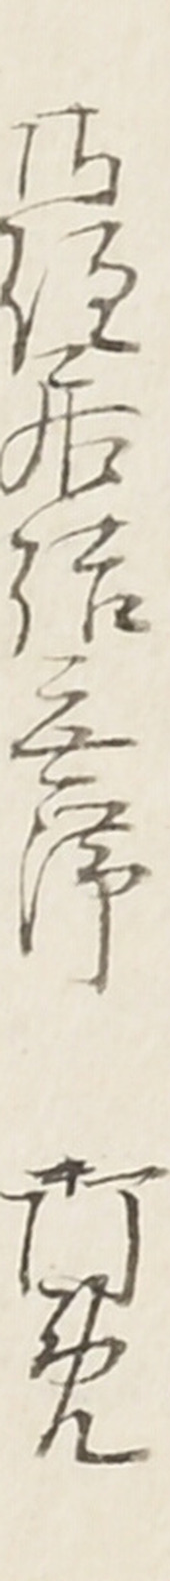御住居詰無滞御免
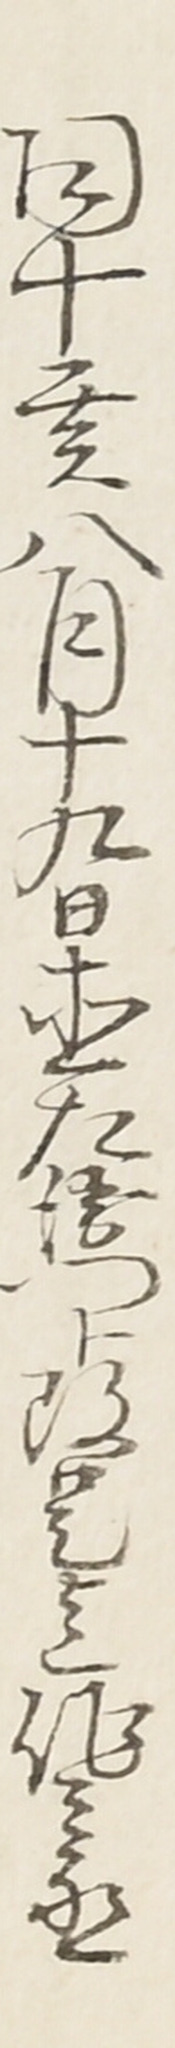一同十亥八月十九日直左衛門ト改是迄作之丞
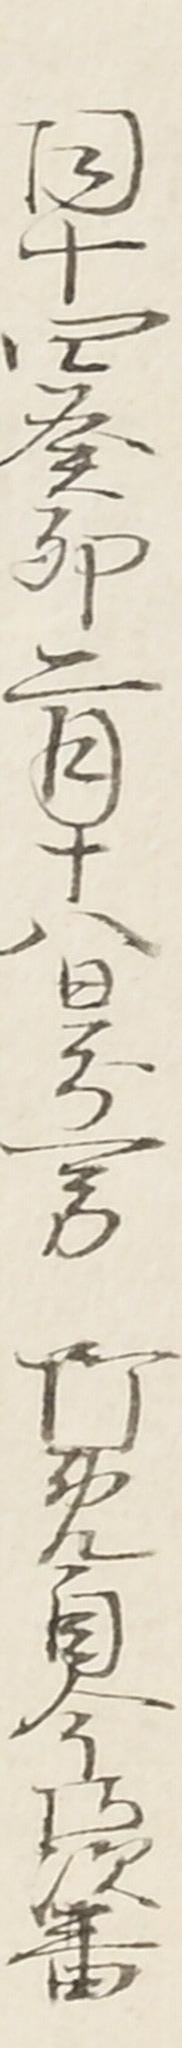一同十四癸卯二月十八日分一方御免自今御次番
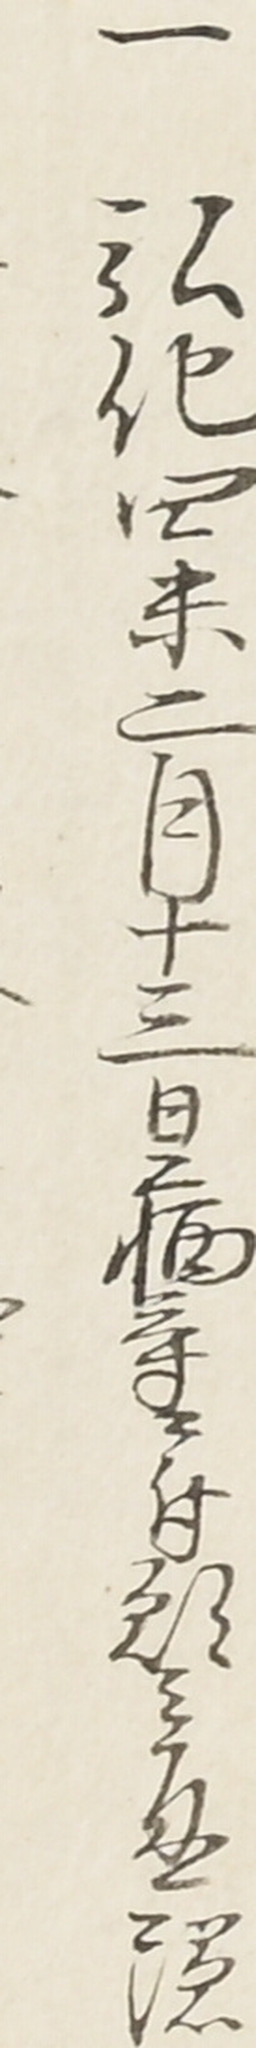一弘化四未二月十三日病気ニ付願之通隠居
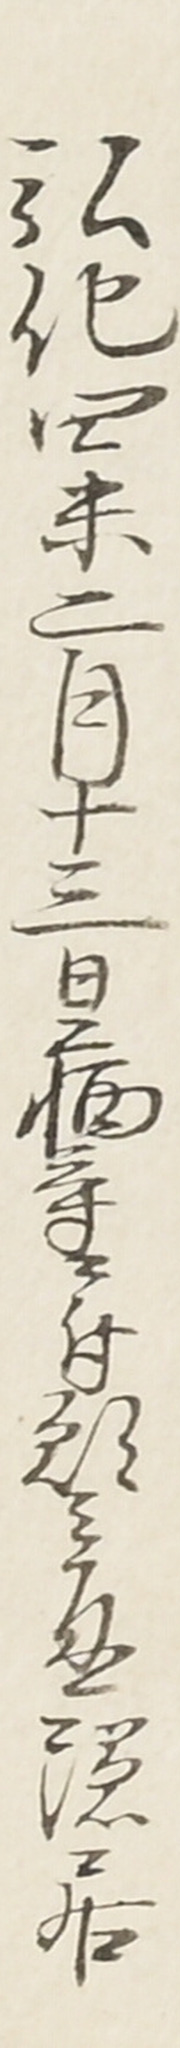一弘化四未二月十三日病気ニ付願之通隠居
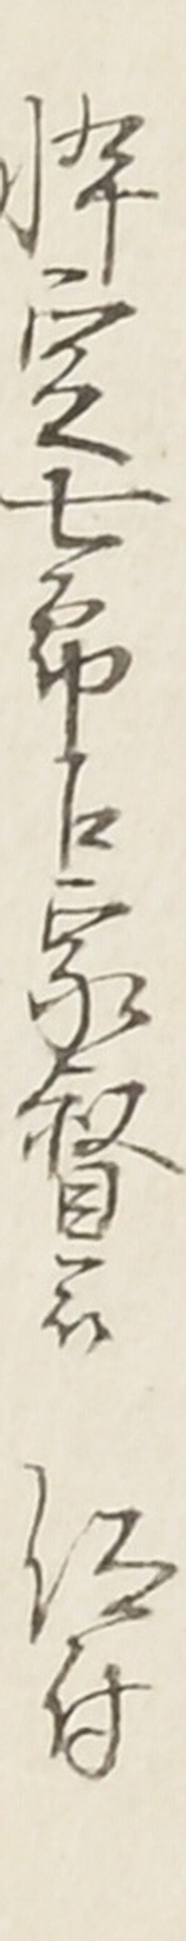忰定七郎江家督被仰付
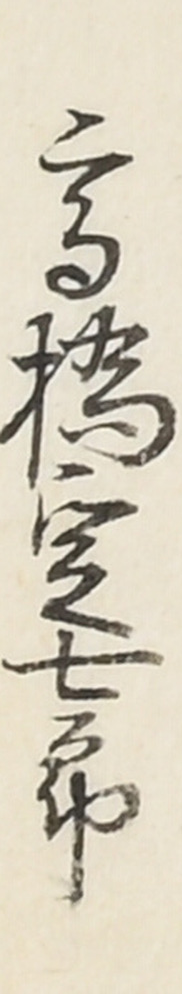高橋定七郎
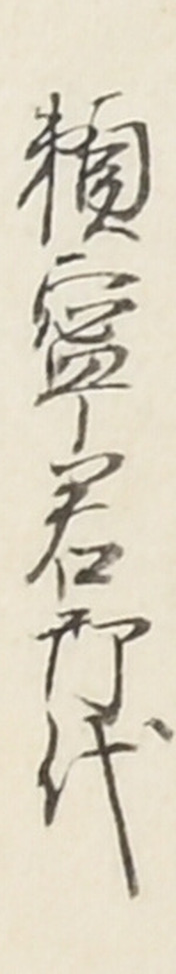頼寧君御代

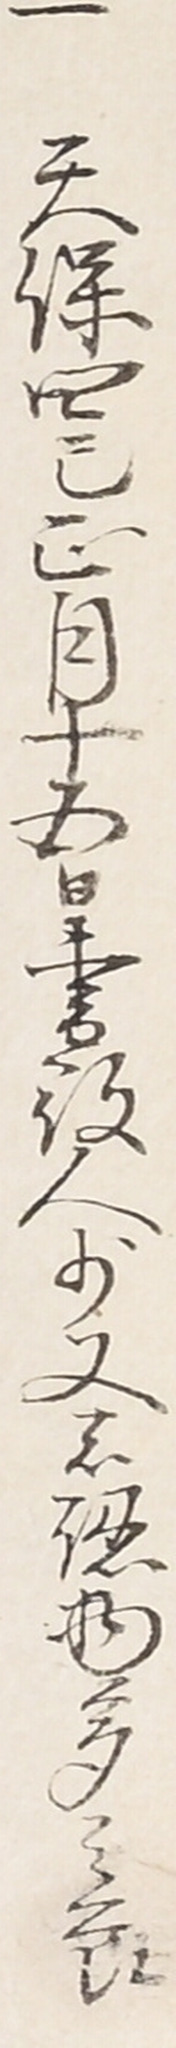一天保四巳正月十五日書役人少又者認物多之節
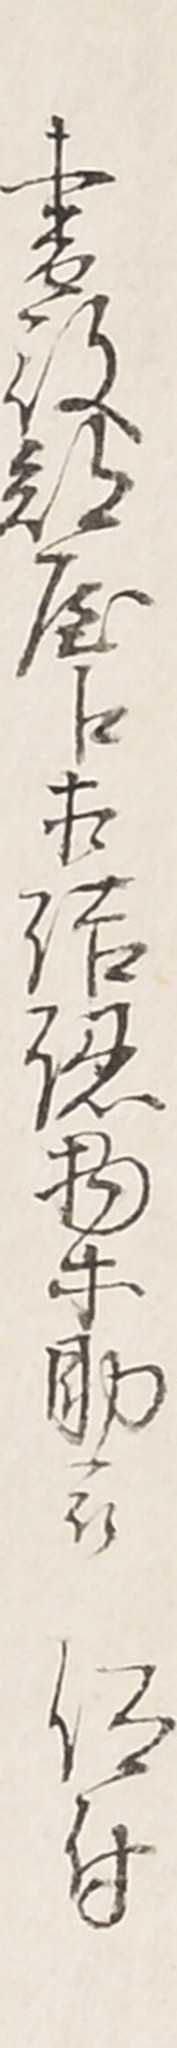書役部屋江相詰認物抔助被仰付
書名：無足諸士勤仕録（四）
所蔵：伊那市立高遠町図書館・合同会社AMANE
